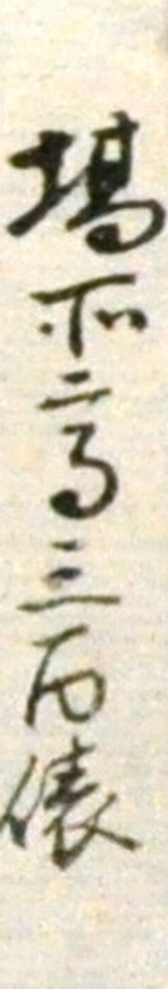場所高三百俵
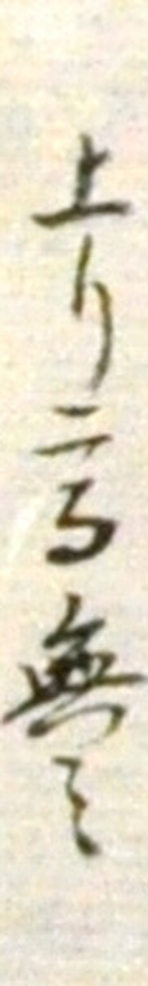上り高無之
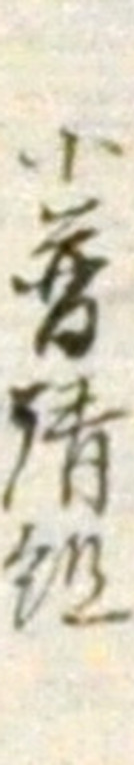小普請組
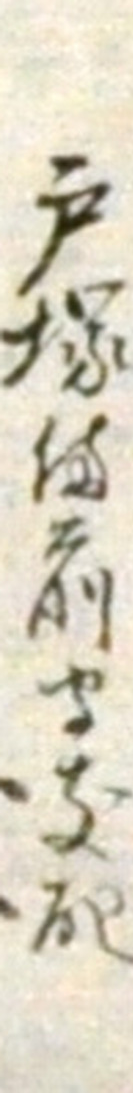戸塚備前守支配
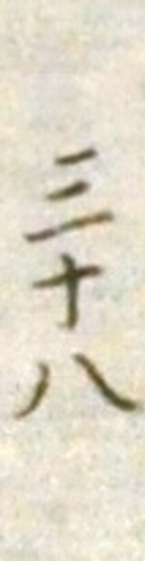三十八
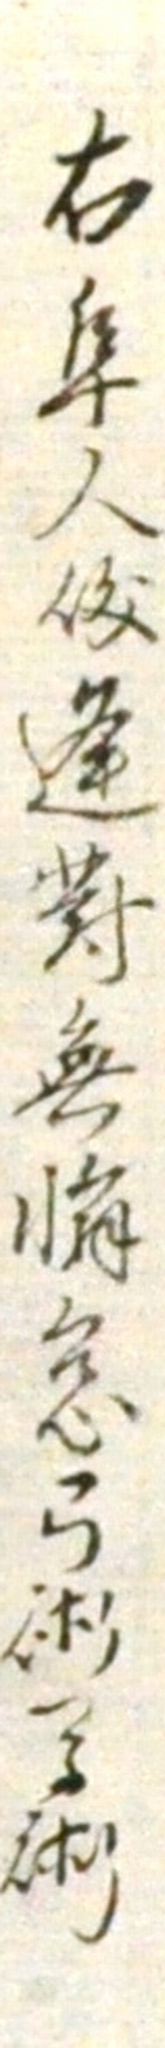右隼人儀逢対無懈怠弓術馬術
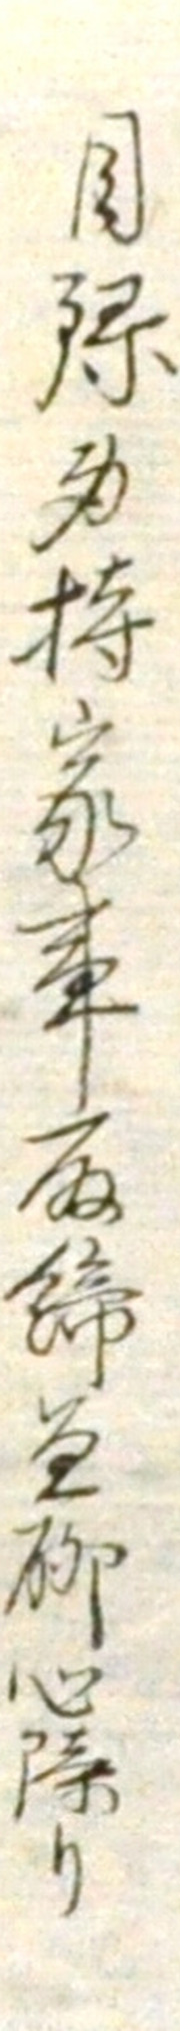目録身持家事取締宜聊心障り
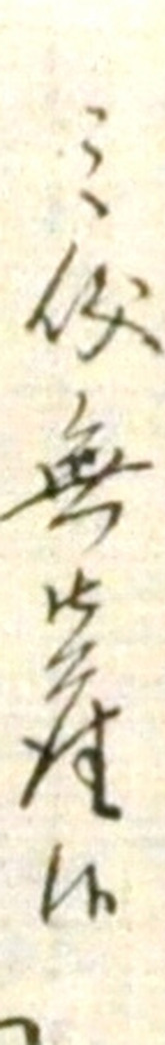之儀無御座候
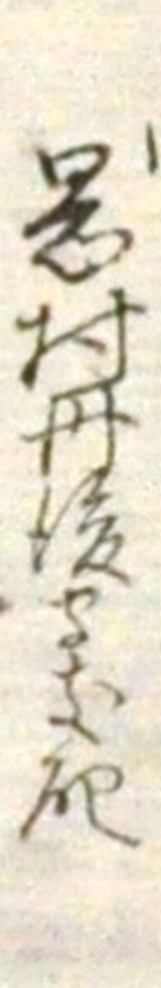岡村丹後守支配
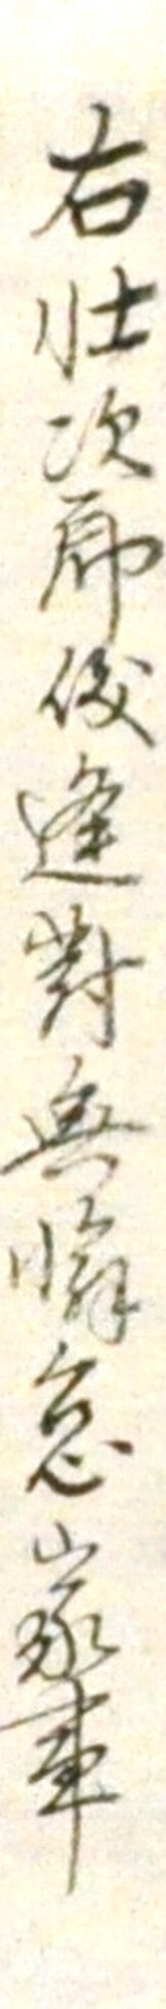右壮次郎儀逢対無懈怠家事
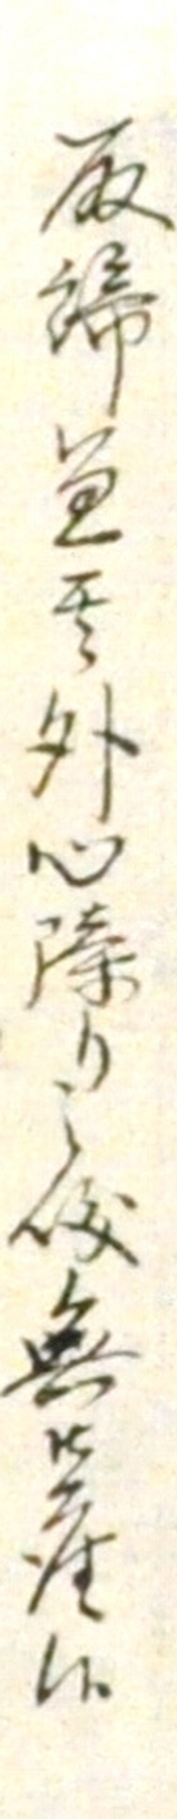取締宜其外心障り之儀無御座候
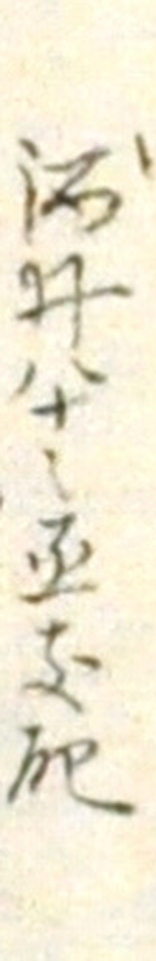酒井八十之丞支配
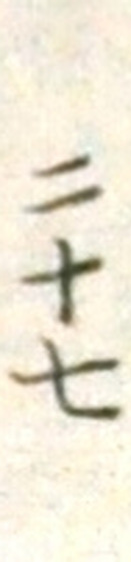二十七
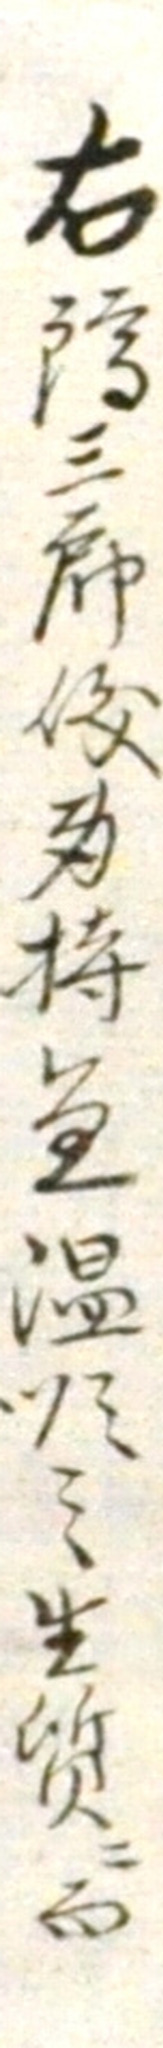右鎬三郎儀身持宜温順之生質にて
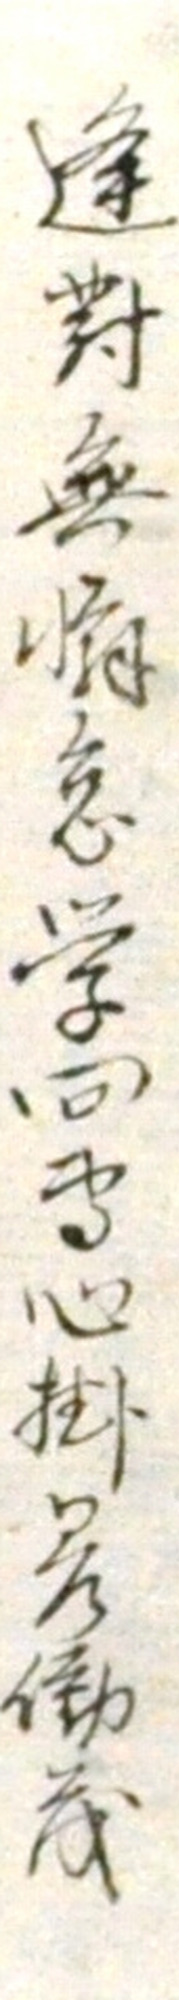逢対無懈怠学問専心掛差働も
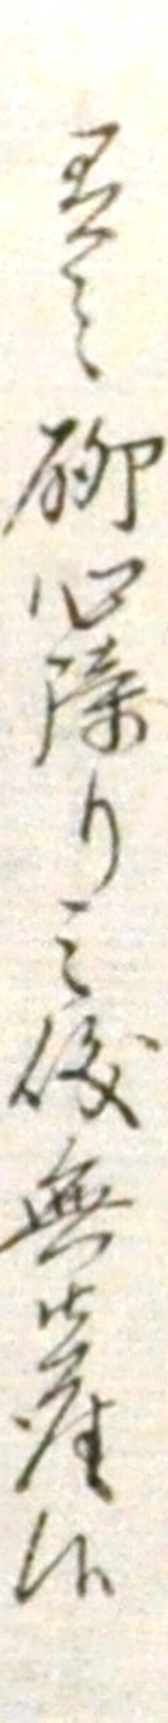有之聊心障り之儀無御座候
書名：右大将様御書院番御入人調
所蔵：伊那市立高遠町図書館・合同会社AMANE
